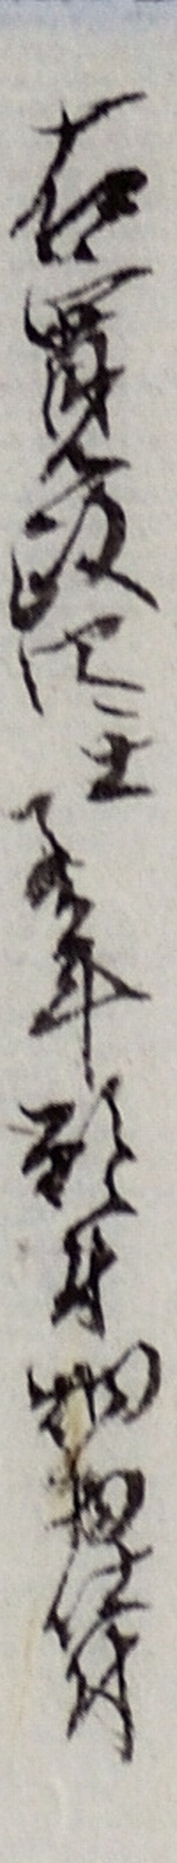右寛政四壬子年願ニ付畑物仕付
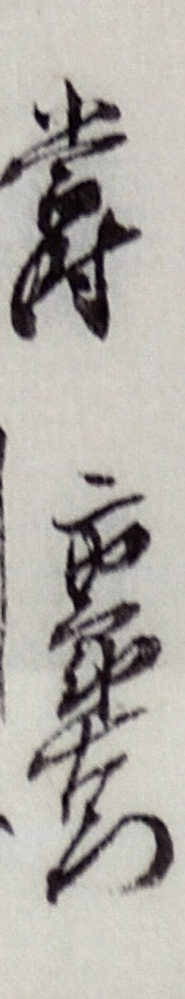当時市郎右衛門
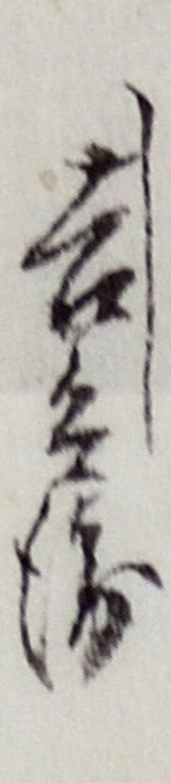吉兵衛
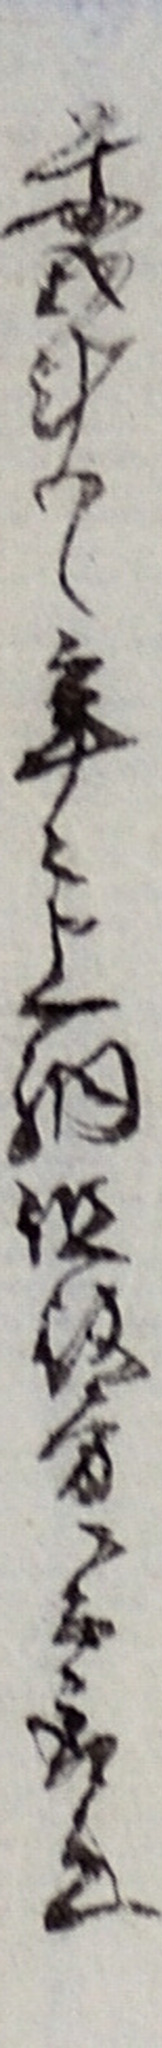米弐斗ツヽ年々上納但役方ニ而取立
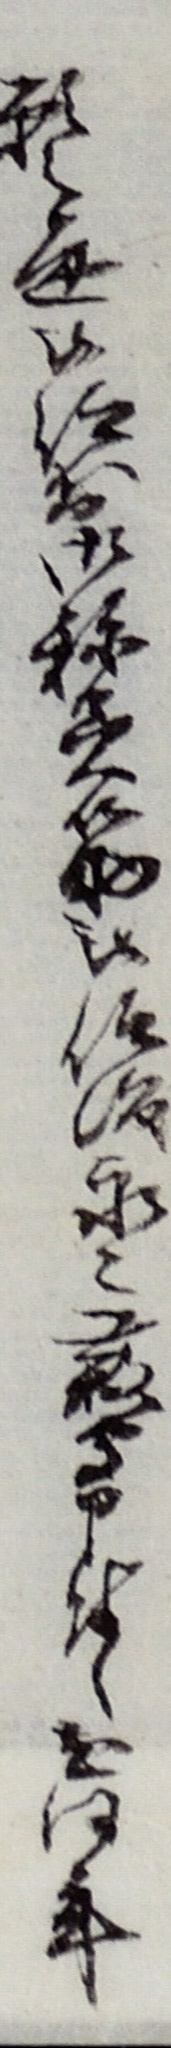願之通被仰出御称美筋被仰渡永々藪守申付候尤同年
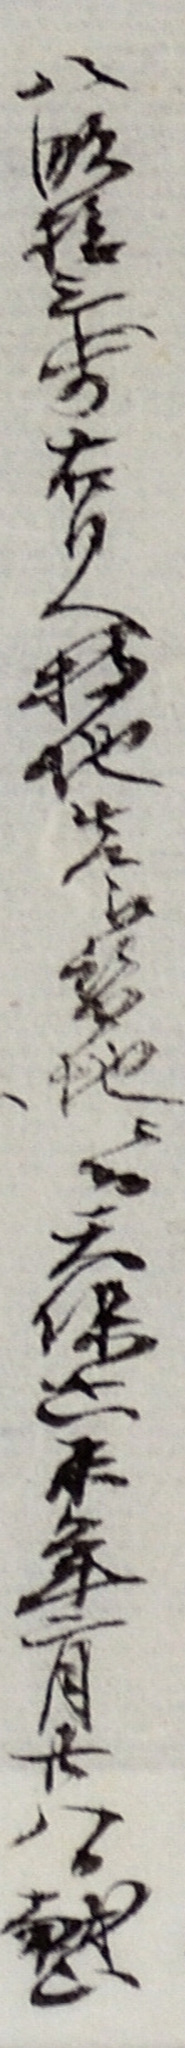八畝拾三歩右同人持地先え替地ニ而天保六未年二月廿八日献山
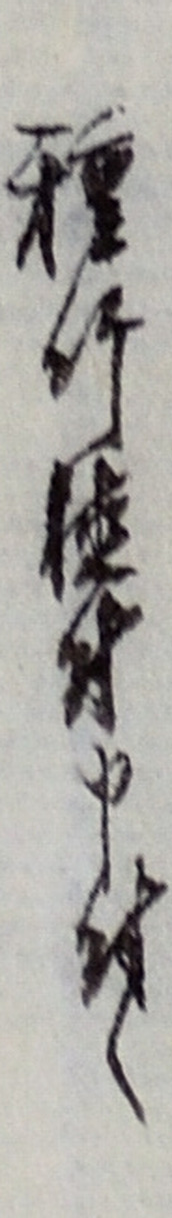種竹植付申付候
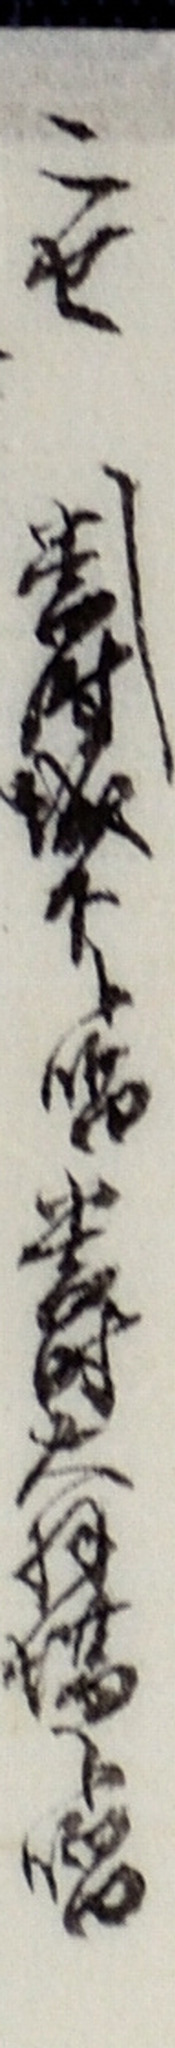こせ当時城下ト唱当時大羽場ト唱
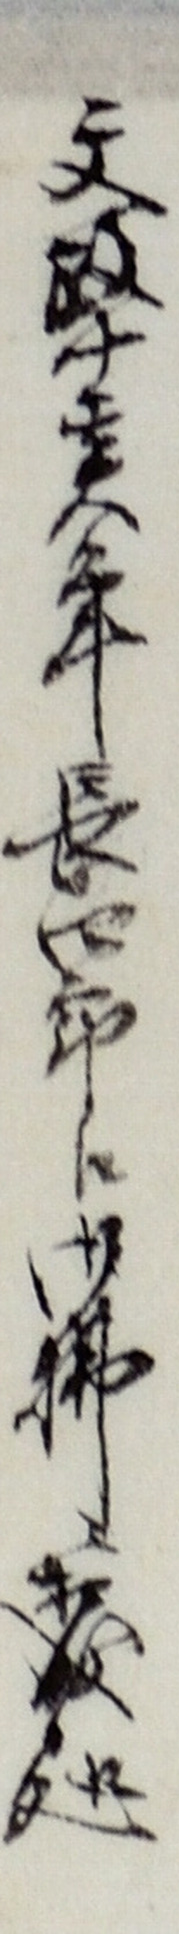文政十亥年長四郎え御払ニ相成候処
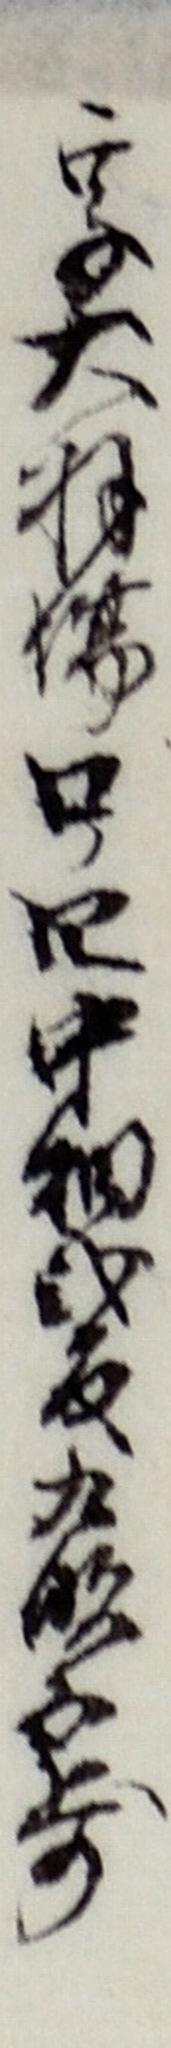字大羽場口ノ四中畑弐反九畝五歩
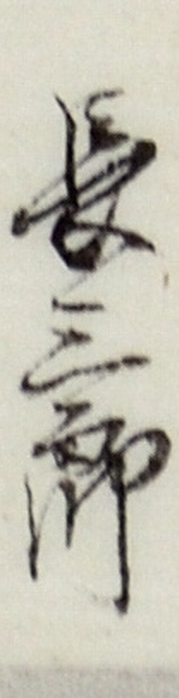長三郎
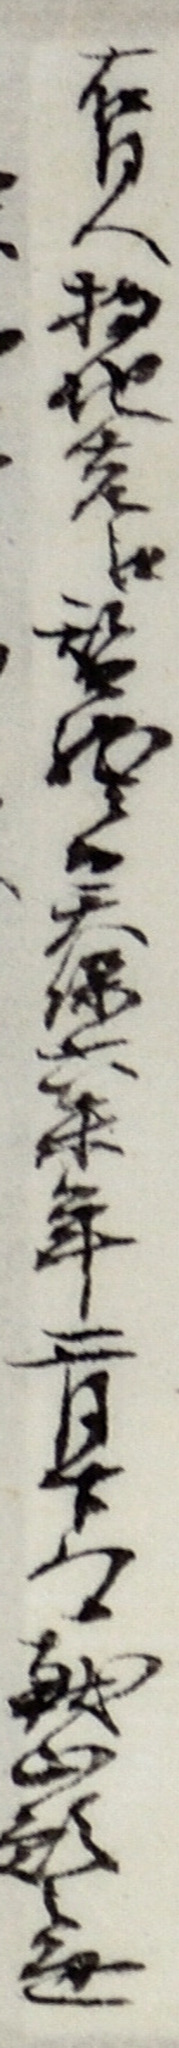右同人持地先え替地ニ而天保六未年二月廿八日献山願之通
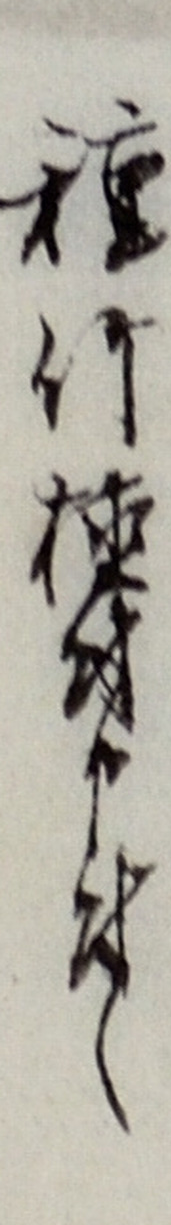種竹植付申付候
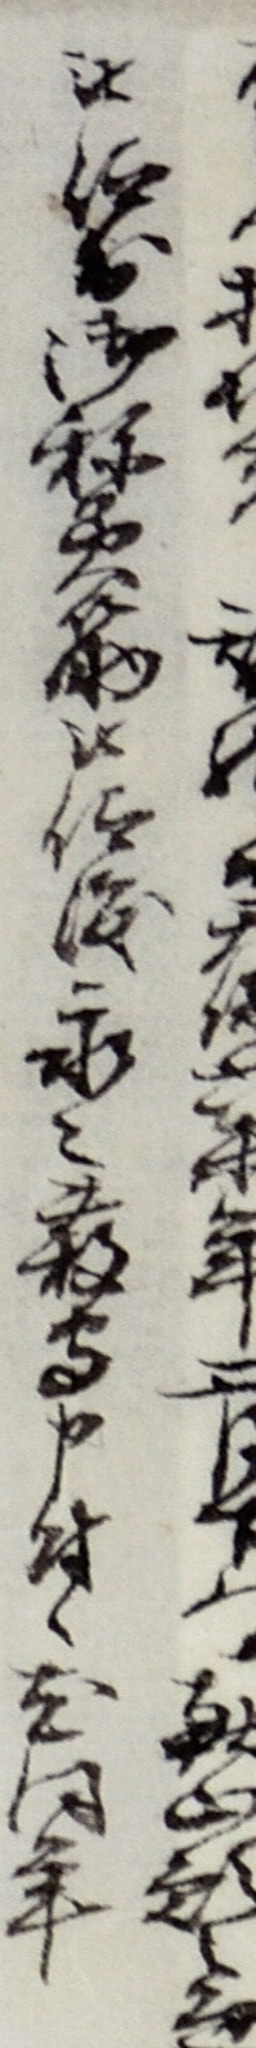被仰出御称美筋被仰渡永々藪守申付候尤同年

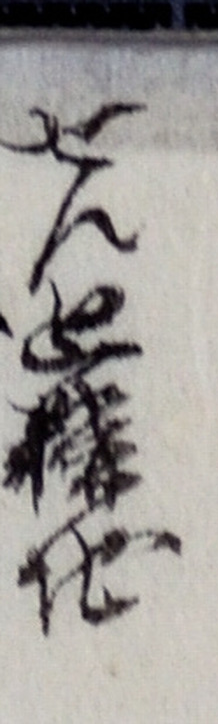せん廻構地
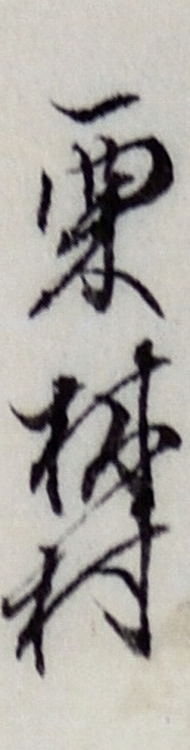栗林村
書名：山林帳草稿
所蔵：伊那市立高遠町図書館・合同会社AMANE
